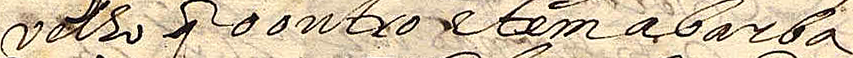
velho q̄ o outro E tem a barba
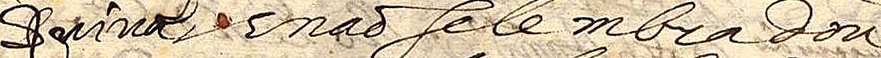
Ruiua, E naõ se lembra dou
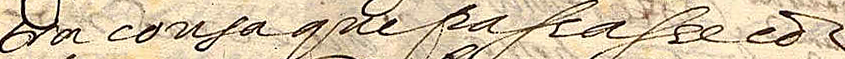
tra cousa que passasse cō
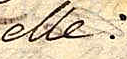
elle:
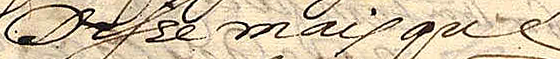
Disse mais que
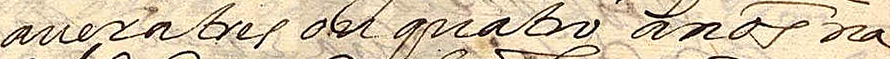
auera tres ou quatro anōs na
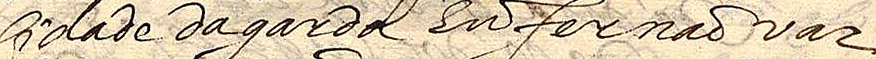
Cidade da garda hū fernaõ vaz
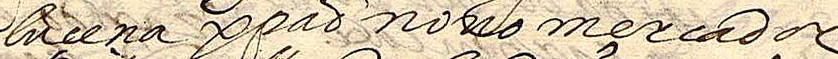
lucena xpaõ nouo mercador
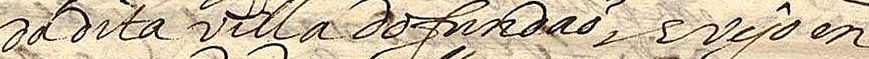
da dita villa do fundaõ, E vejo en
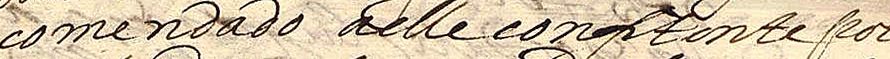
comendado a elle confitente por
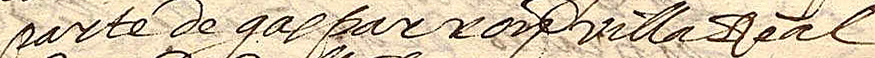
parte de gaspar roiz̄ villa Real
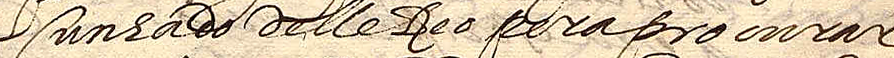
Cunhado delle Reo pera procurar
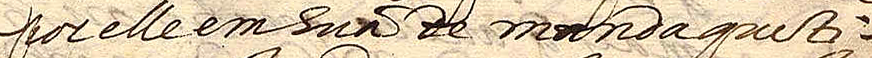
por elle em huā demanda que ti
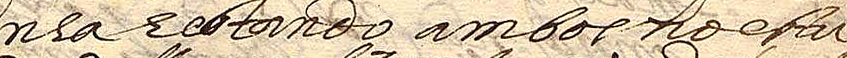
nha E estando ambos no estu
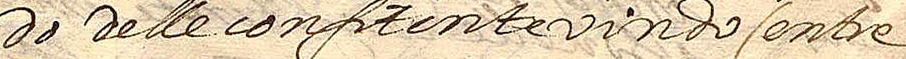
do delle confitente vindo (entre
